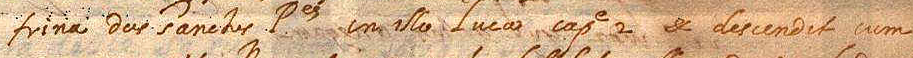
trina dos sanctos P.es in illo Luca cape 2 & descendit cum
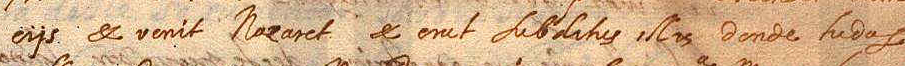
eijs & venit Nazaret & erat Subditus illis donde todas
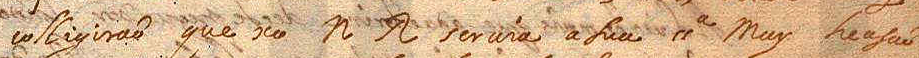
colligiraõ que xo N Sr seruia a sua ssa May he a saõ
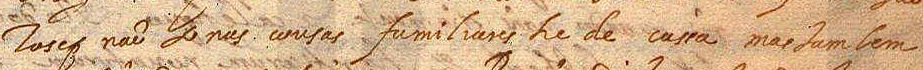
Iosep naõ so nas cousas familiares he de cassa mas tambem
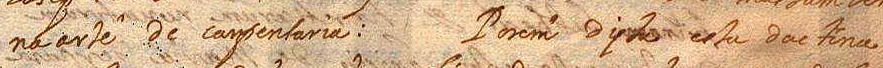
na arte de carpentaria: Porem dista esta doctrina
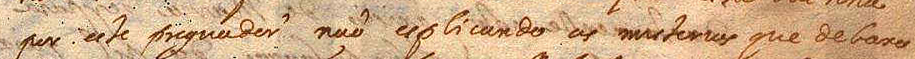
por este preguador naõ esplicando os misterios que debaxo
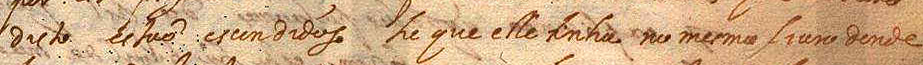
disto estaõ escondidos he que elle tinha no mesmo liuro donde
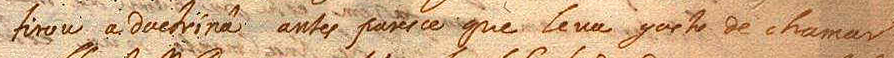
tirou a doctrina antes parece que leua gosto de chamar
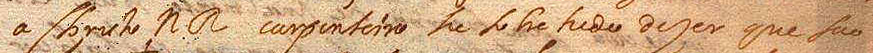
a Christo N Sr carpinteiro he sobretudo dizer que saõ
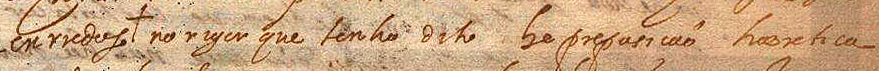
enrredos + no rigor que tenho dito he preposiçaõ heretica
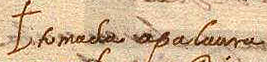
+ tomada a palaura
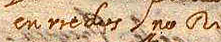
enrredos no Ri
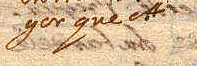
gor que ett
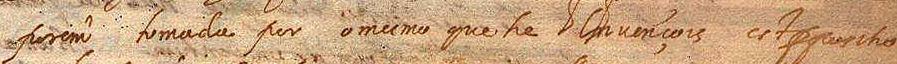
porem tomada por o mesmo que he Inuençoĩs est ꝓpositio
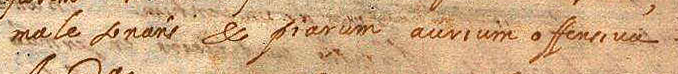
male sonans & piarum aurium offensiua
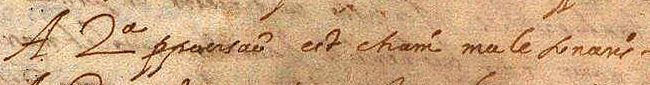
A 2a ꝓpocisaõ est cham male sonans
